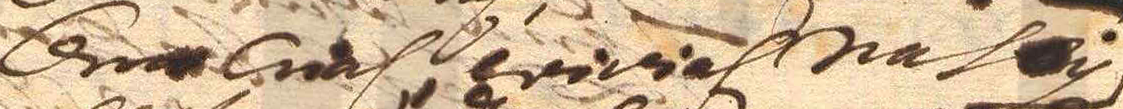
Como Criaꝭ e viviaꝭ na Ley
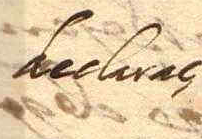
declaraç
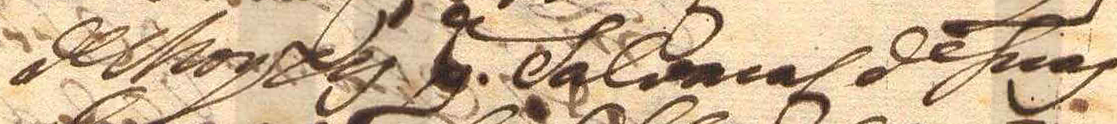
de Moyzes p.a Salvaçaꝭ de suas
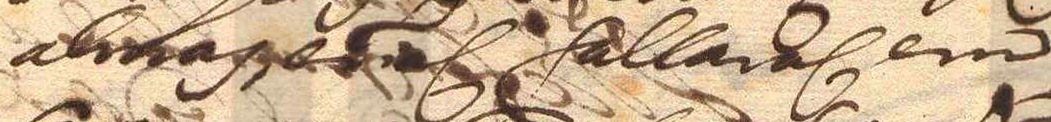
almas, e naꝭ fallaraꝭ em
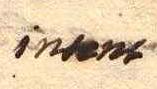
intent
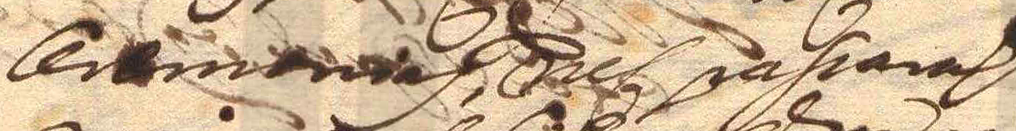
ceremonias, neꝭ passaraõ
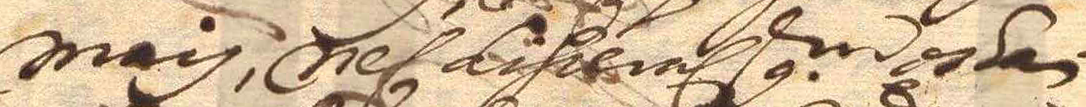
mais, neꝭ disseraꝭ q.m os ha
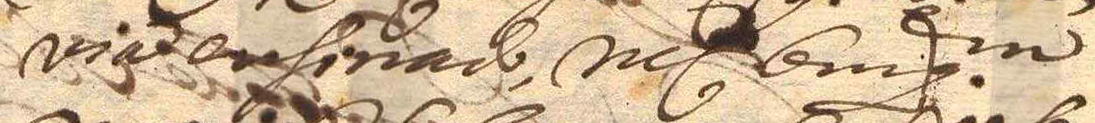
via ensinado, neꝭ Com q.m
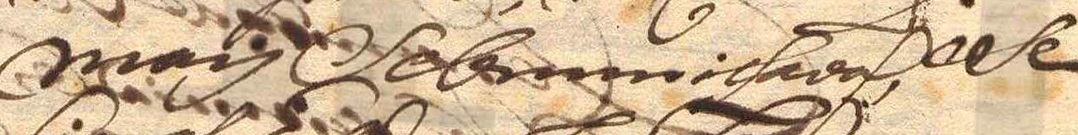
mais se Comunicavaꝭ, e Se
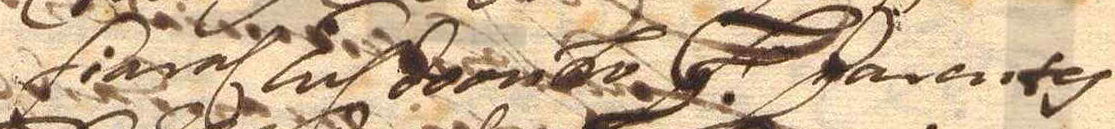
fiaraꝭ huꝭ do outro p.lo parentes
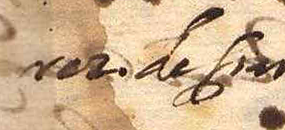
rez. de fiar
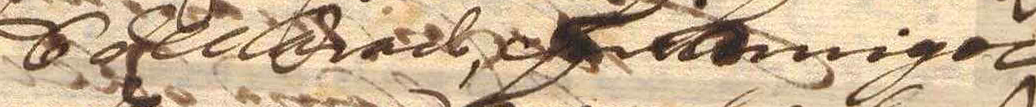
e declarado, e por amigos
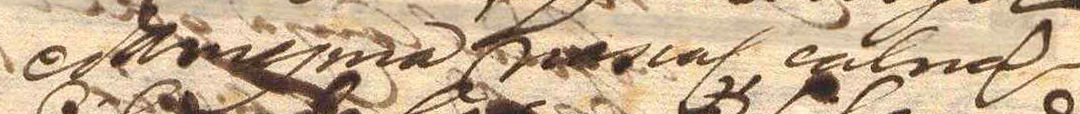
e da mesma nasçaꝭ, e al naꝭ
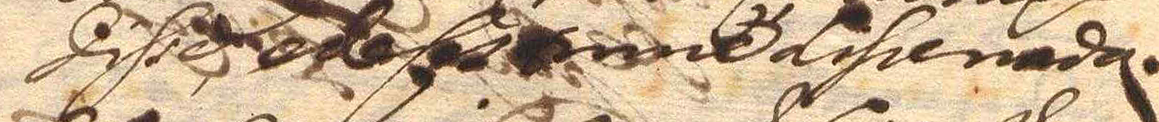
disse, e do Costume disse nada.
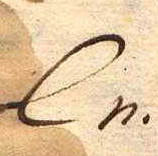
C n.
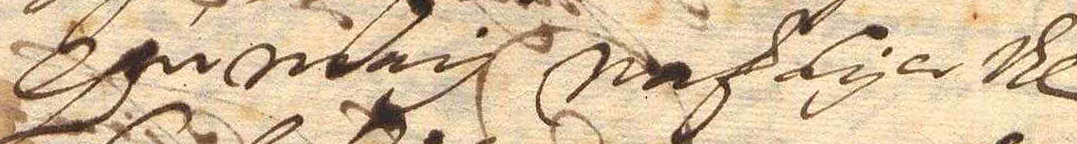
E por mais naõ dizer lhe
